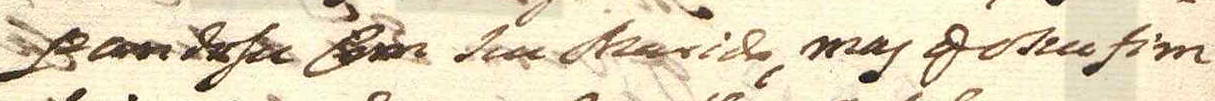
pandosse Com seu Marido, mas q̄ o seu fim
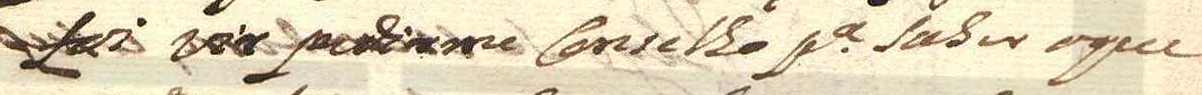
foi vir pedirme Conselho p.a saber o que
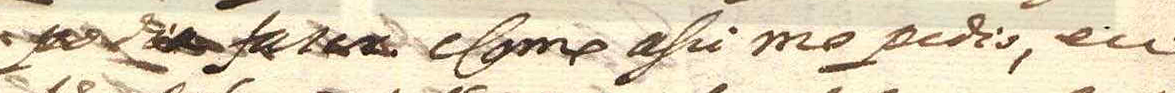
podia fazer e Como assi mo pedio, eu
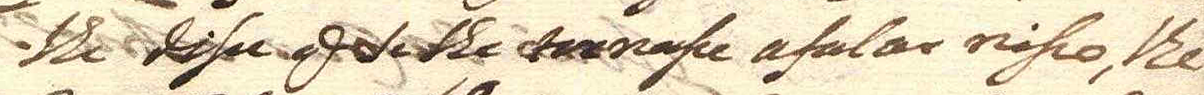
lhe disse q̄ se lhe tornasse a falar nisso, lhe
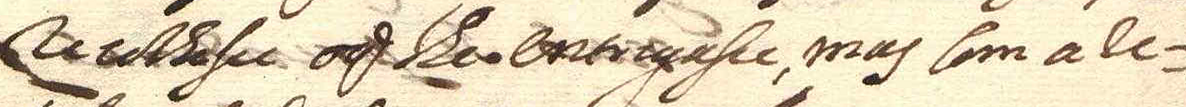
Recolhesse o q̄ lhe entregasse, mas com a Re
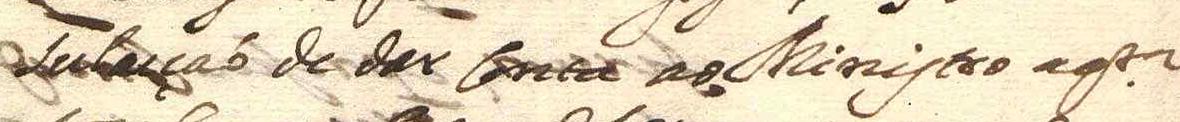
suluçaõ de dar conta ao Ministro a q.m
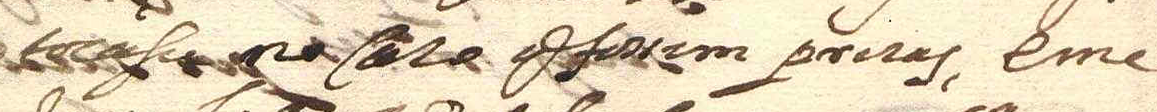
tocasse no Cazo q̄ fossem prezas, e me
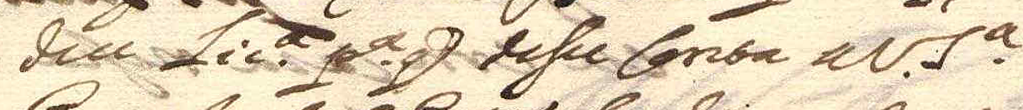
deu Lic.a pa. q̄ desse Conta a V. S.a
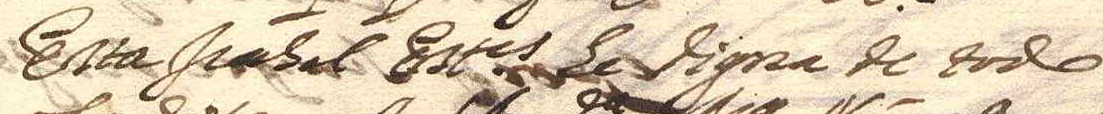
Esta Jsabel Est.es he digna de todo
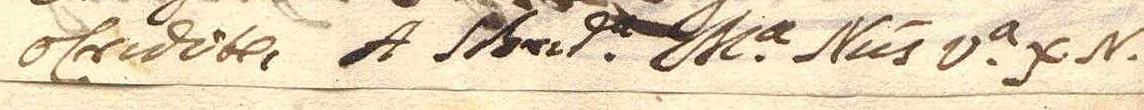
o Credito, A sobred.a M.a Nus̄ V.a x. N.
